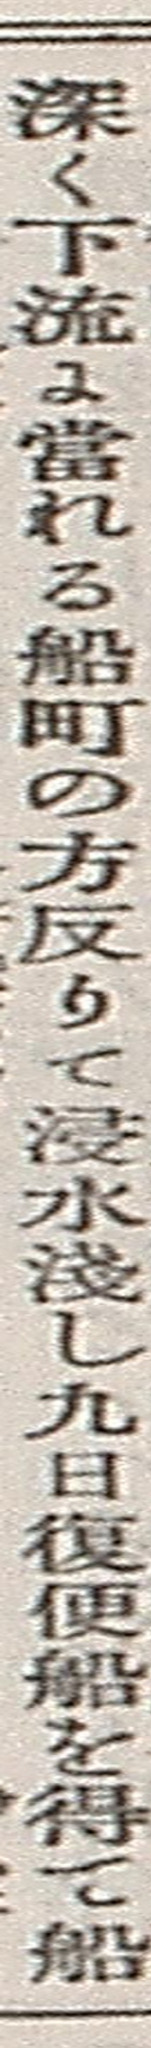深く下流に当れる船町の方反りて浸水浅し九日復便船を得て船
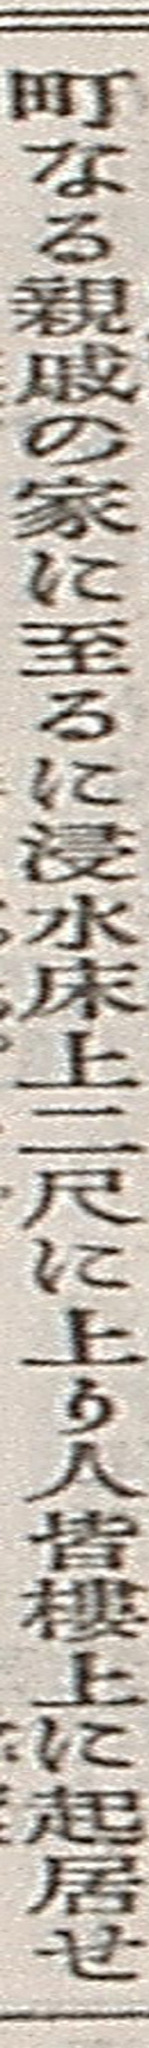町なる親戚の家に至るに浸水床上二尺に上り人皆楼上に起居せ
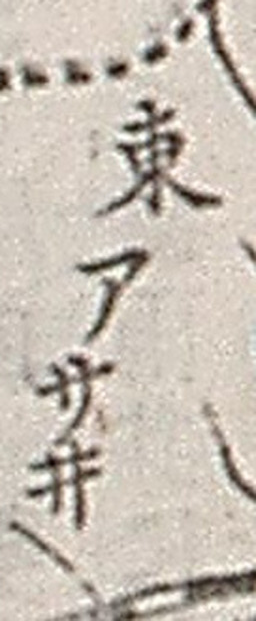東アサ井
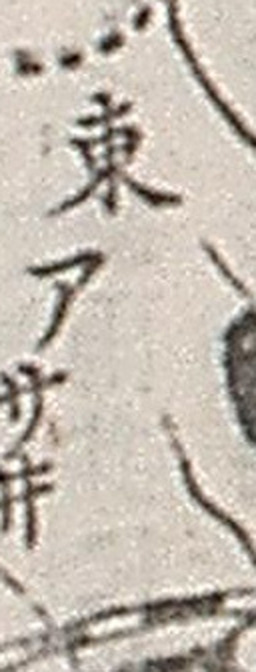東アサ井
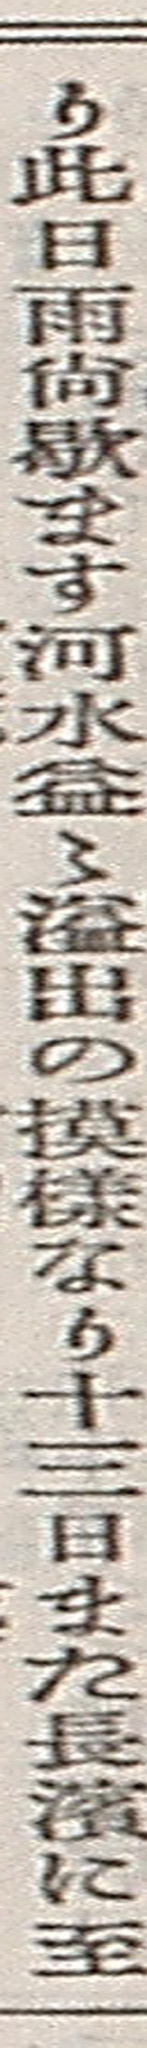り此日雨尚歇ます河水益々溢出の模様なり十三日また長浜に至
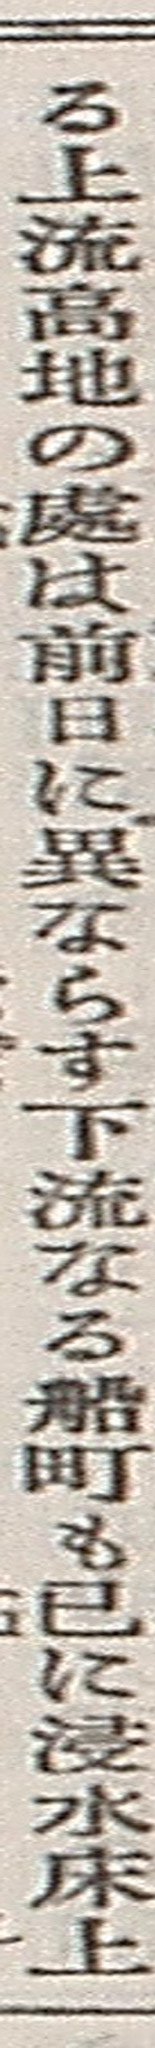る上流高地の処は前日に異ならす下流なる船町も已に浸水床上
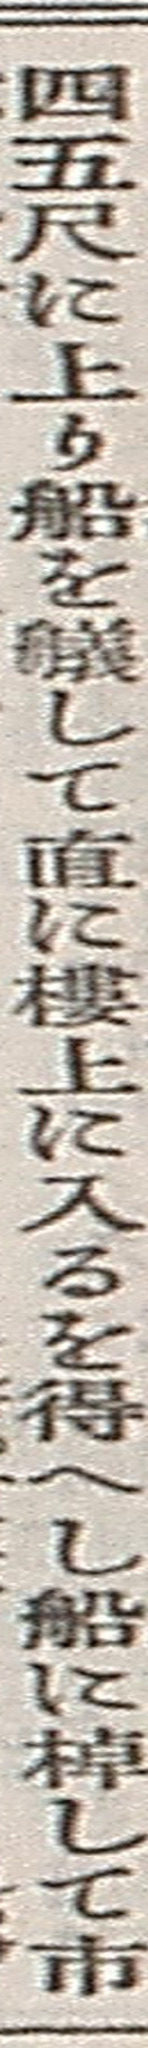四五尺に上り船を艤して食に楼上に入るを得へし船に棹して市
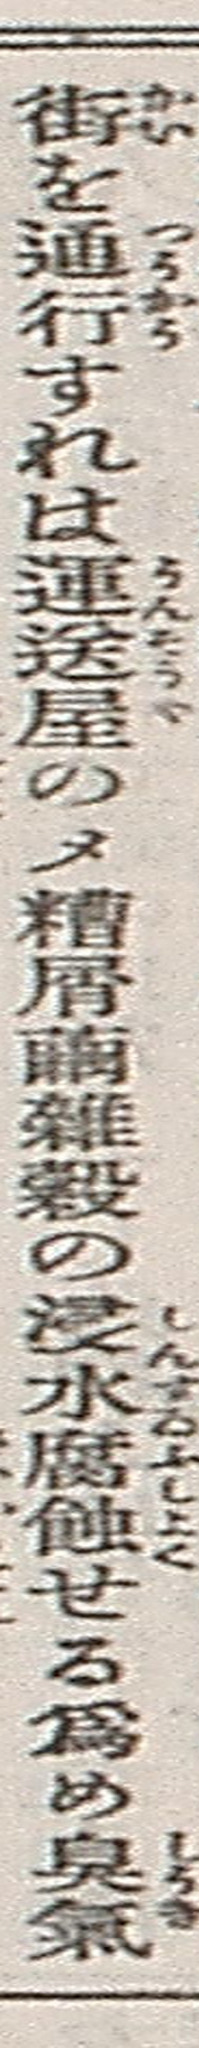街を通行すれは運送屋のメ糟屑繭雑穀の浸水腐食せる為め臭気
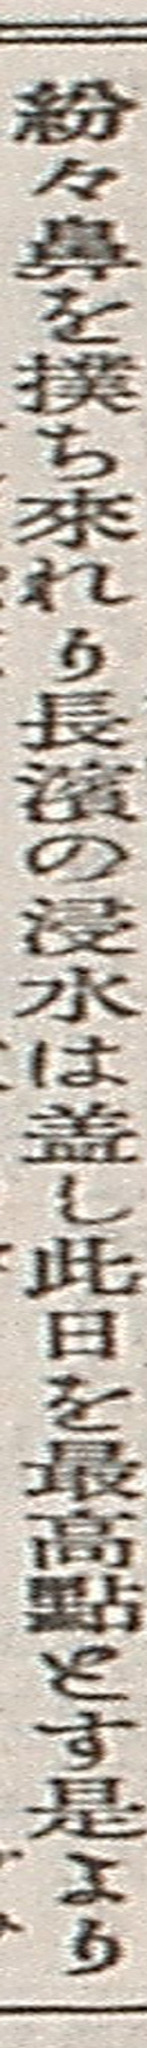粉々鼻を撲ち来れり長浜の浸水は蓋し此日を最高点とす是より
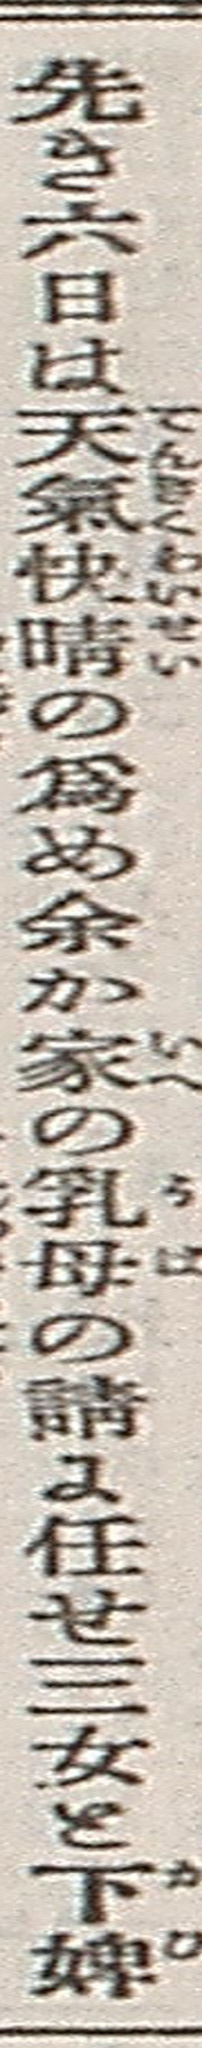先き六日は天気快晴の為め余か家の乳母の許に任せ三女と下婢
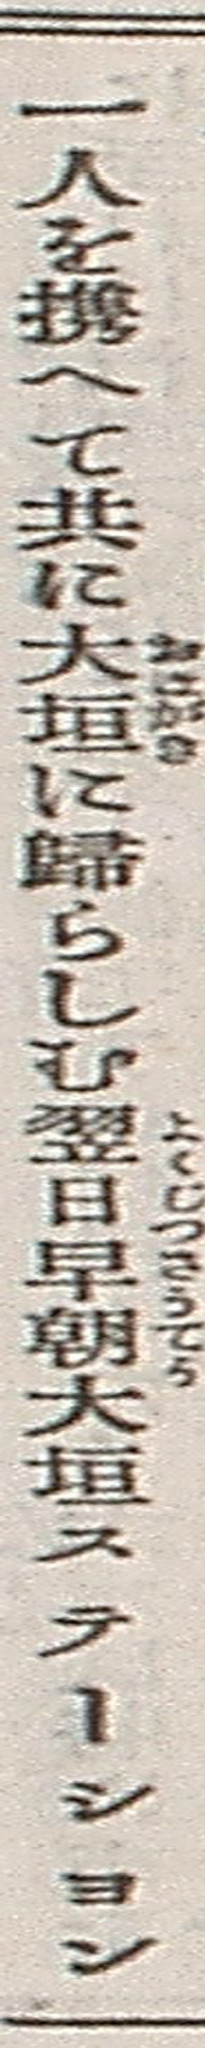一人を携へて共に大垣に帰らしむ翌日早朝大垣ステーション

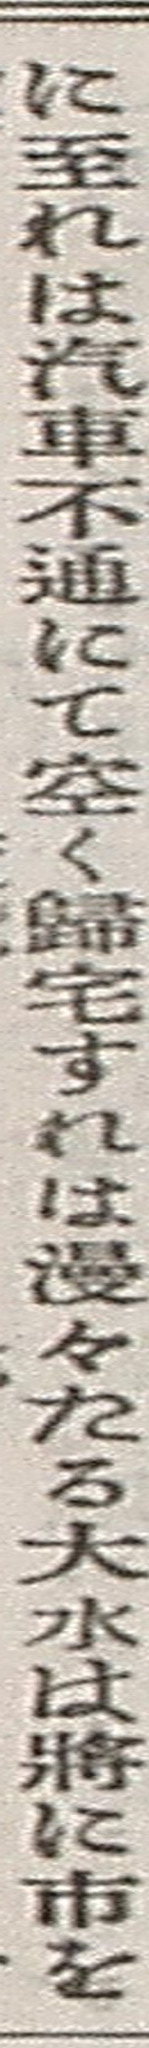に至れは汽車不通にて空く帰宅すれは漫々たる大水は将に市を
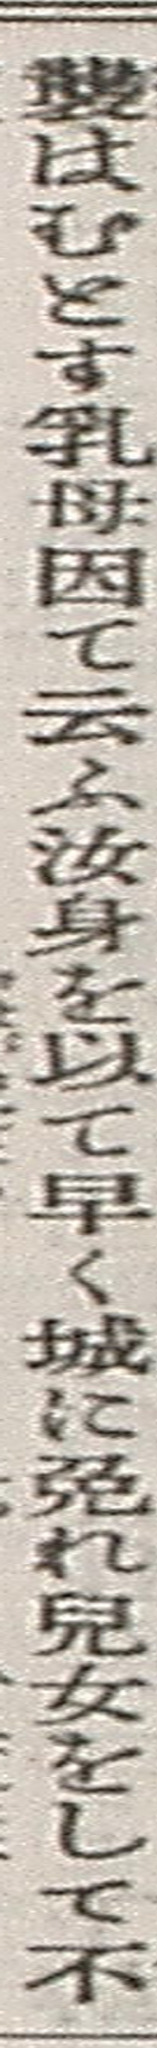襲はむとす乳母因て云ふ汝身を以て早く城に免れ兒女をして不
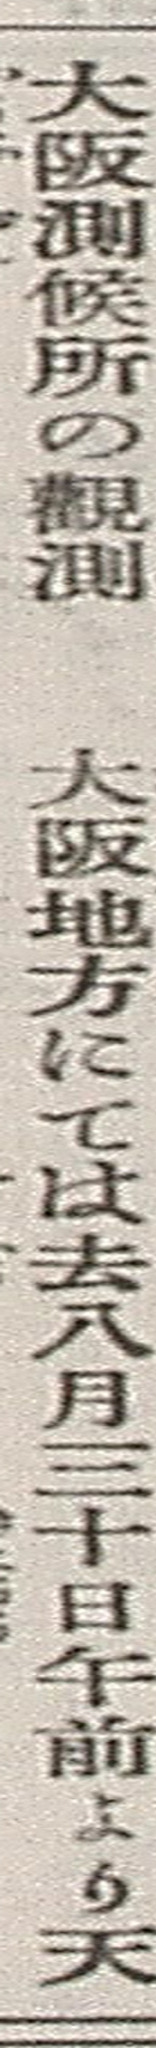大坂測候所の観測大坂地方にては去八月三十日午前より天
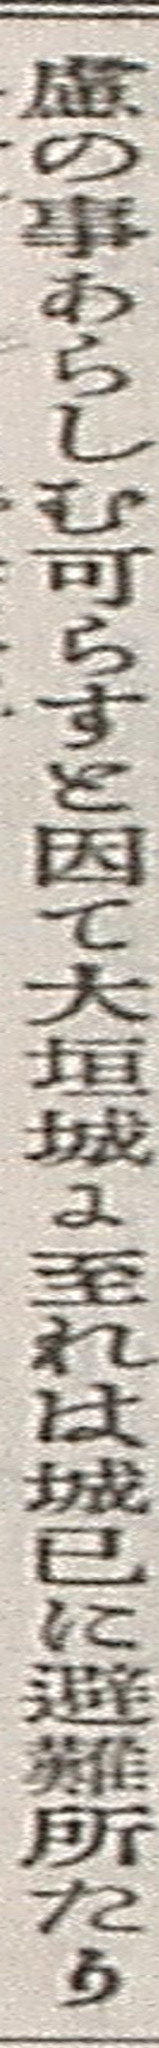慮の事あらしむ可らすと因て大垣城に至れは城已に避難所たり
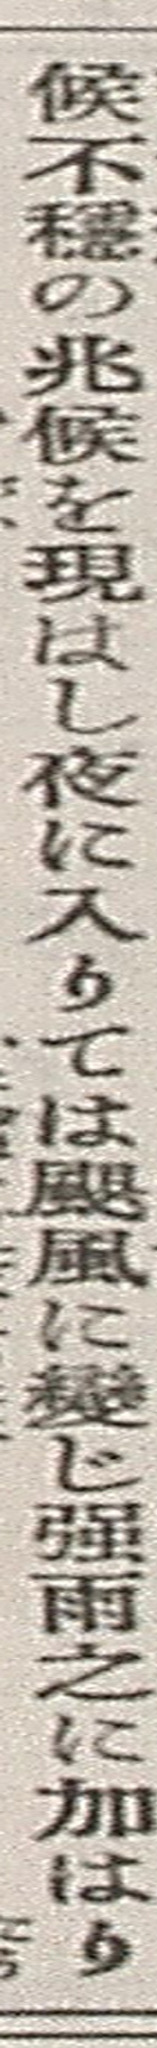候不穏の兆候を現はし夜に入りては颶風に変じ強雨之に加はり
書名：風俗畫報臨時増刊第百二十八號　洪水被害録（下）
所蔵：東京大学地震研究所図書室 Earthquake Research Institute Library, The University of Tokyo, JAPAN
